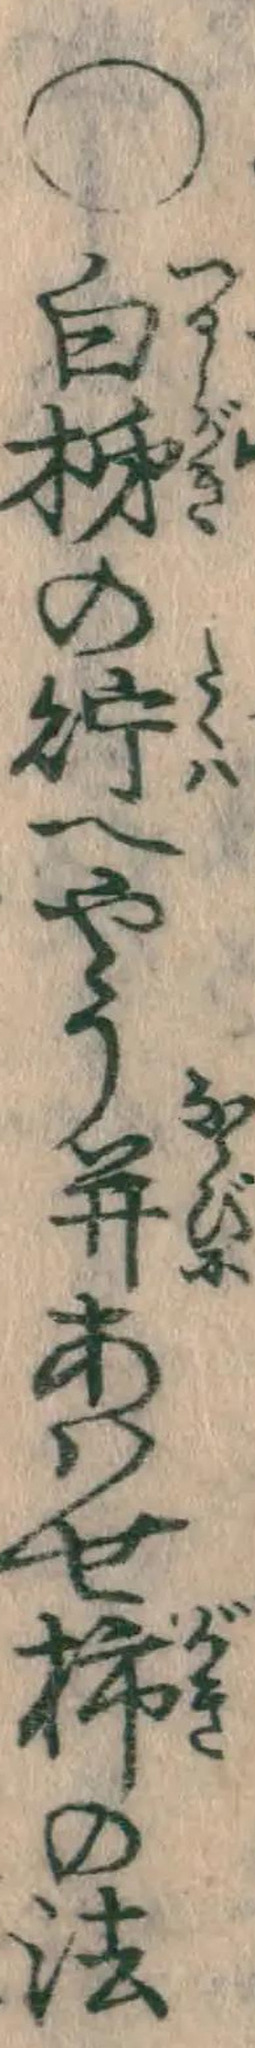○白柿の貯へやう并あはせ柿の法
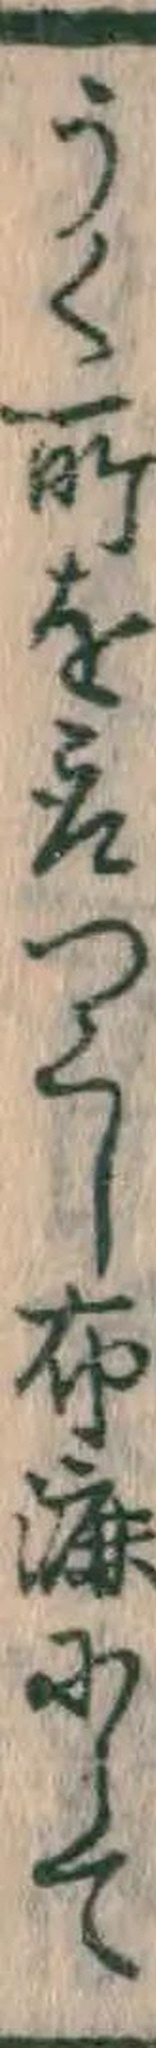うく所を取つくし布漉にして
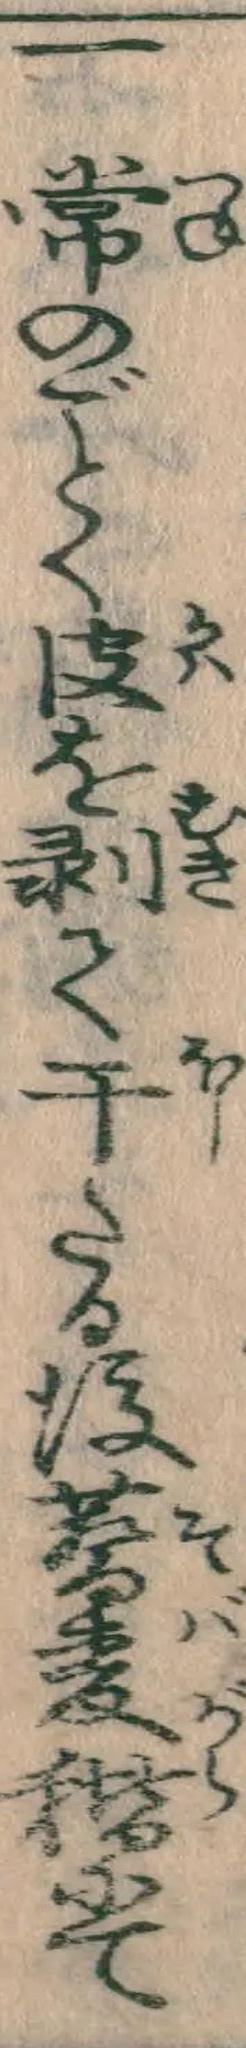一常のごとく皮を剥て干たる後蕎麦稭にて
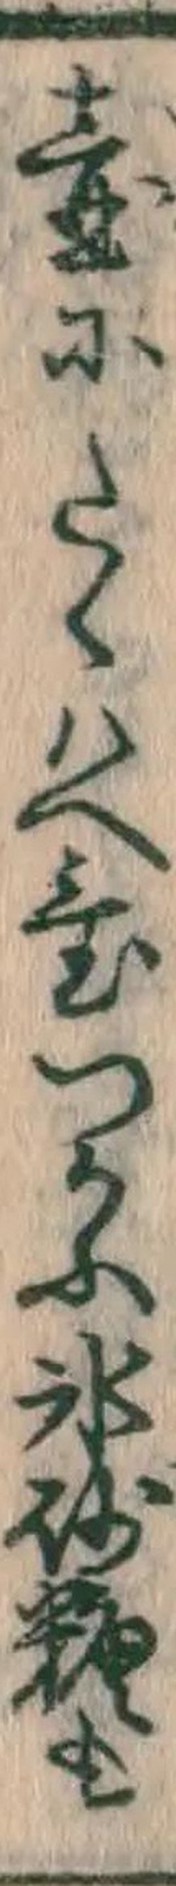壺にたくはへ置つかふ氷砂糖も
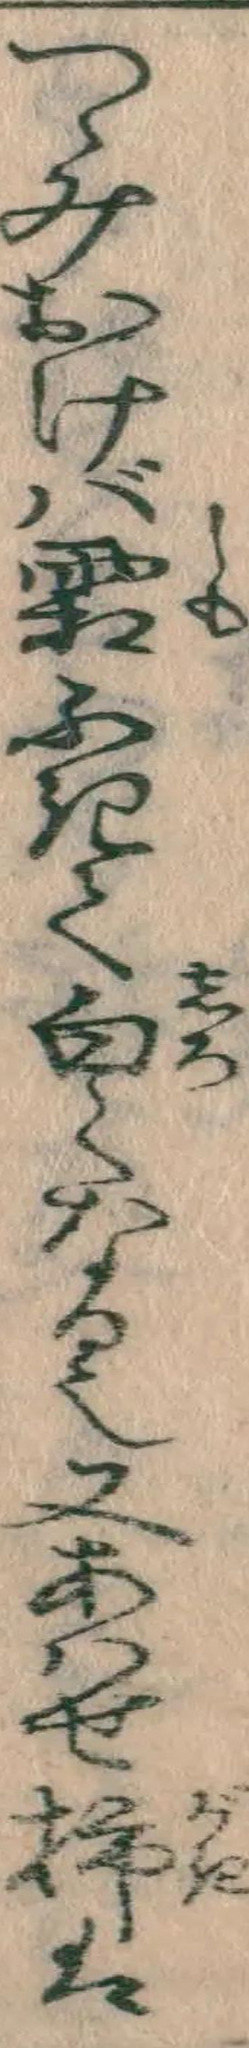つゝみおけば霜ふきて白くなる也又あはせ柿は
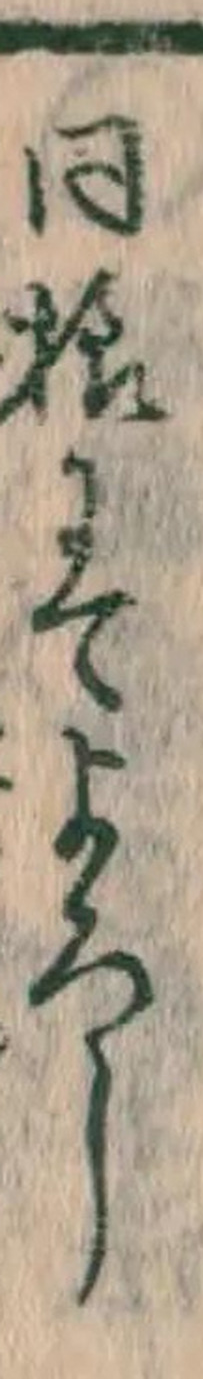同様にてよろし
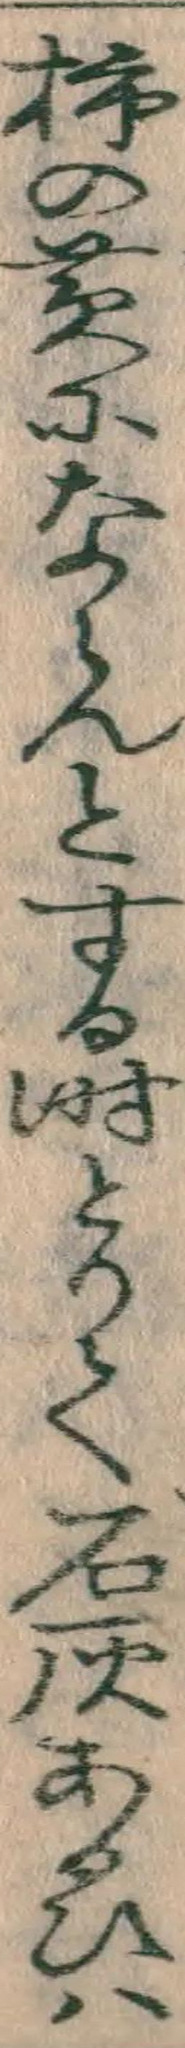柿の黄にならんとする時とりて石灰あるひは
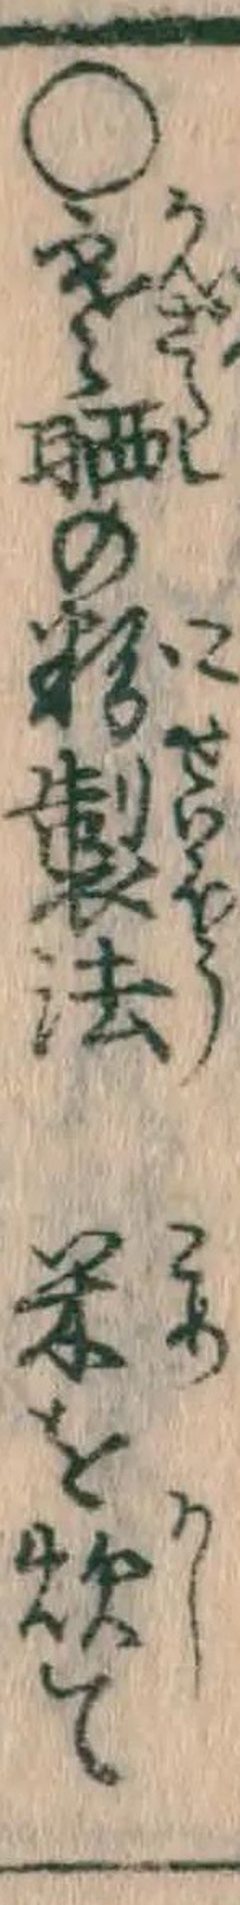○寒晒の粉製法米を炊て
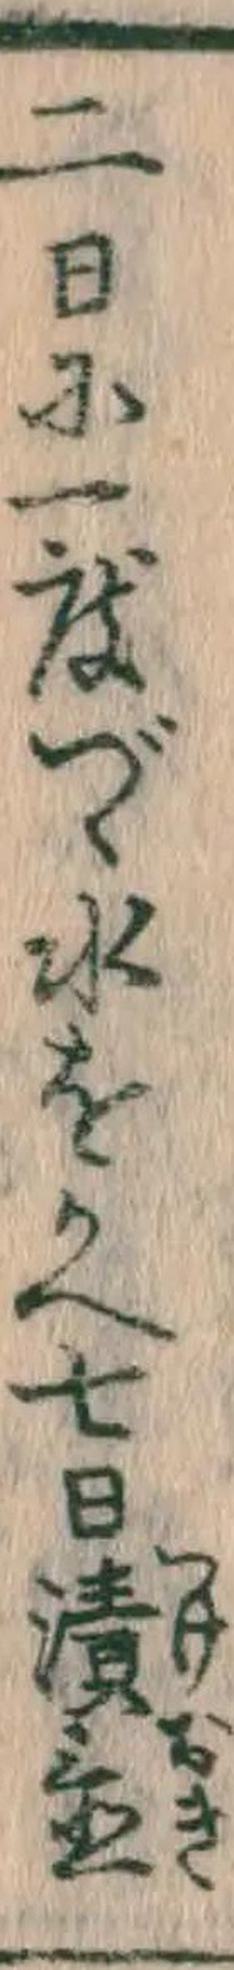二日に一度づゝ水をかへ七日漬置
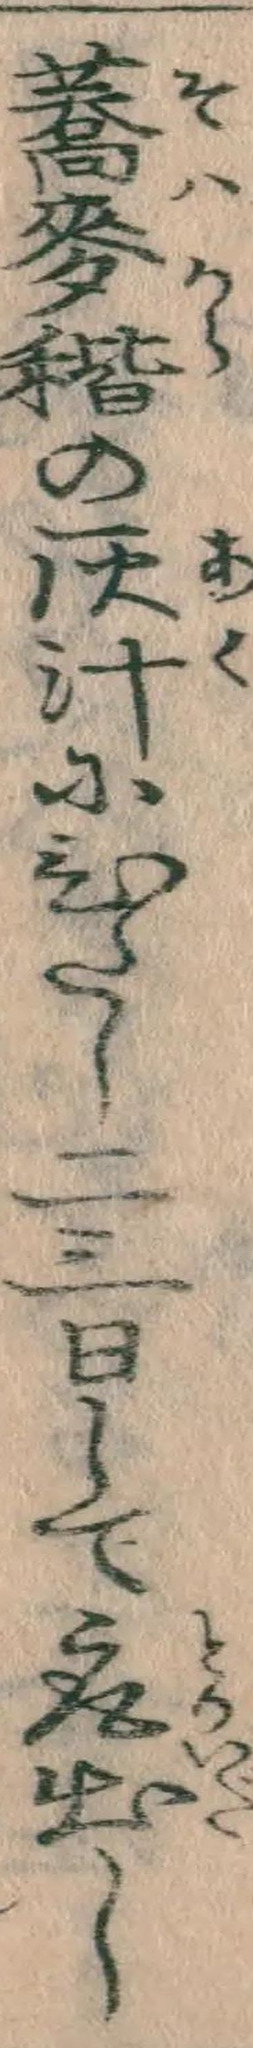蕎麦稭の灰汁にひたし二三日して取出し
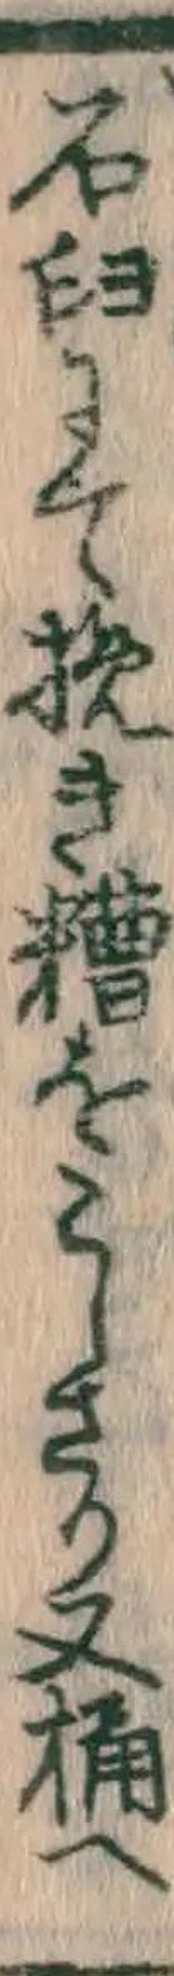石臼にて挽き糟をこしさり又桶へ
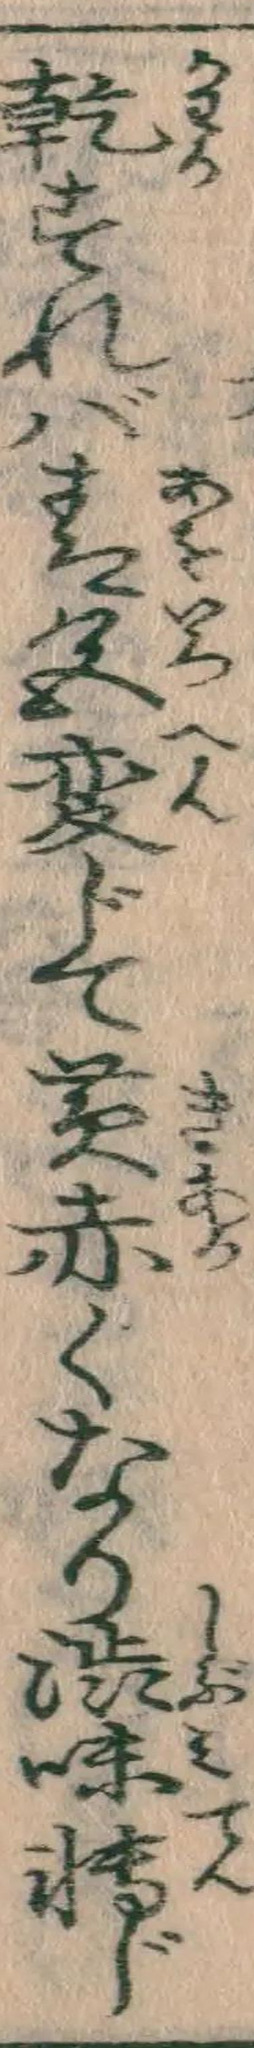乾すれば青色変じて黄赤くなり渋味転じ
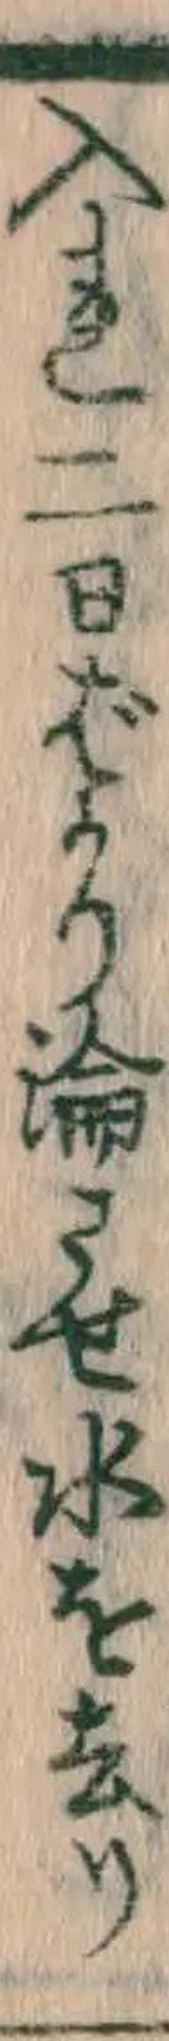入れ二日ばかり淪させ水を去り
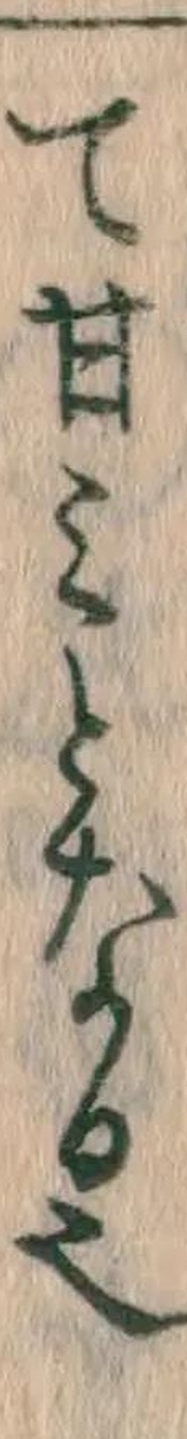て甘みとなる也
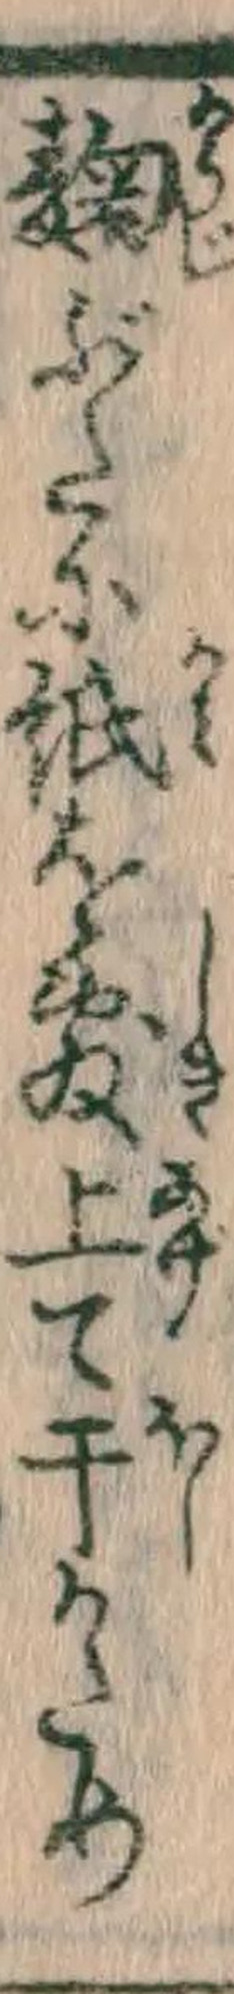麹ぶたに紙を敷上て干かため
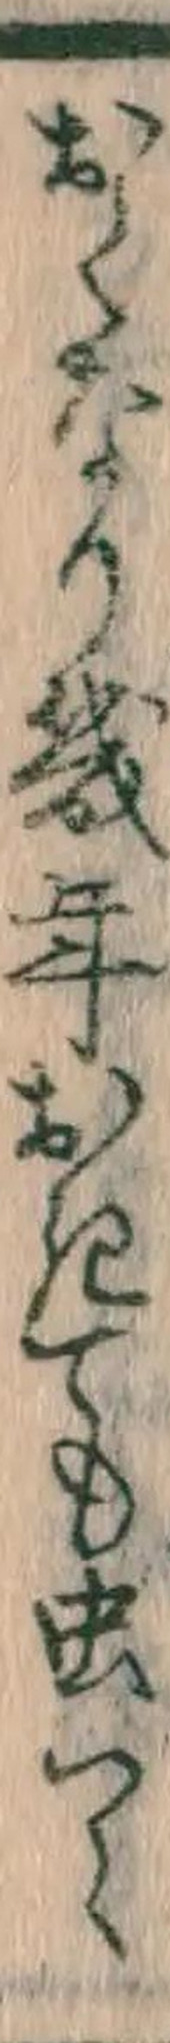おくなり幾年おきても虫つく
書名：広益秘事大全 3巻. [5]
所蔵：国立国会図書館 National Diet Library, JAPAN
